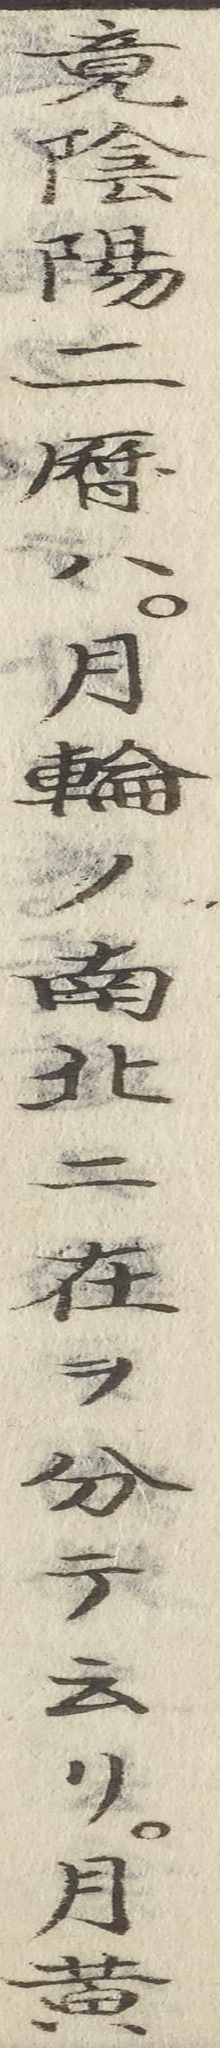竟陰陽二暦ハ。月輪ノ南北ニ在ヲ分テ云リ。月黄
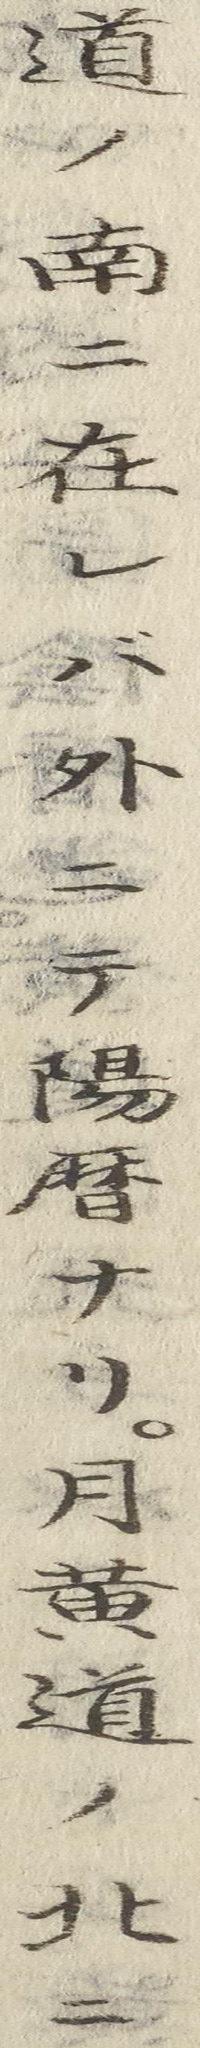道ノ南ニ在レバ外ニテ陽暦ナリ。月黄道ノ北ニ

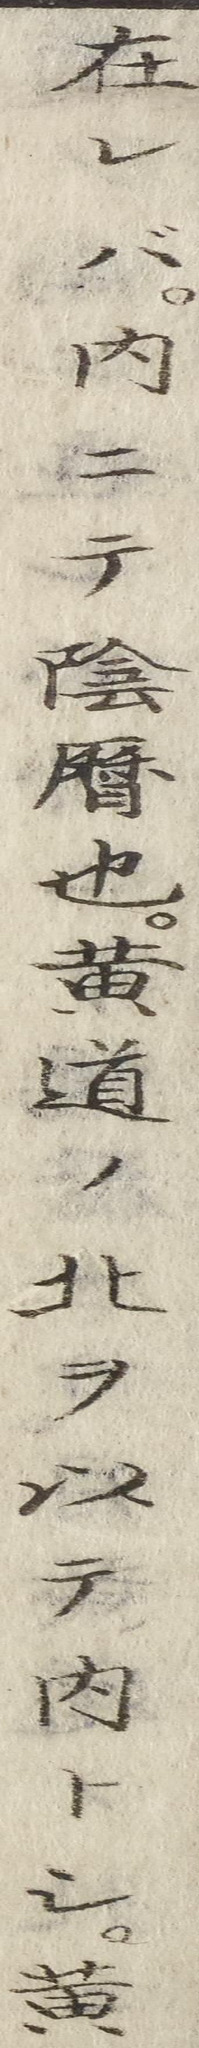在レバ。内ニテ陰暦也。黄道ノ北ヲ以テ内トシ。黄
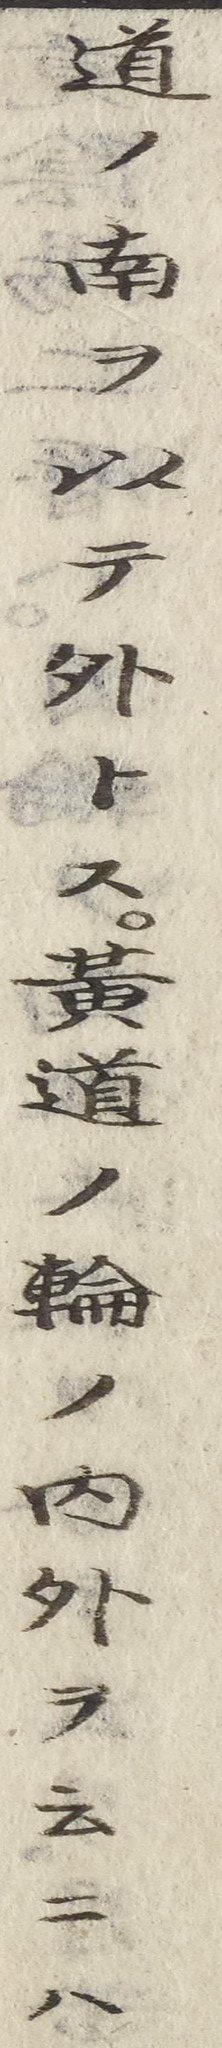道ノ南ヲ以テ外トス。黄道ノ輪ノ内外ヲ云ニハ
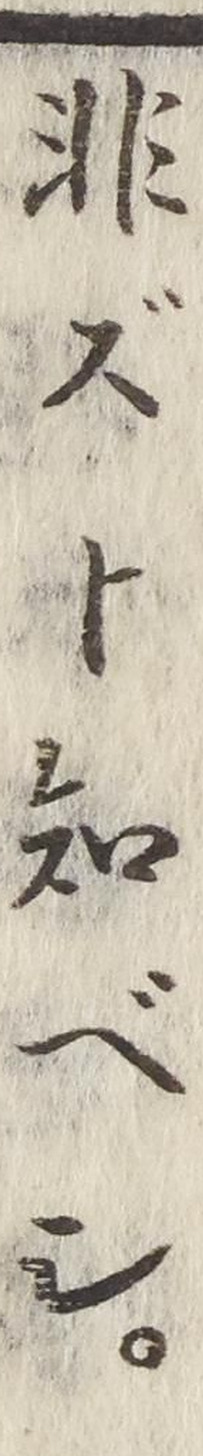非ズト知ベシ。
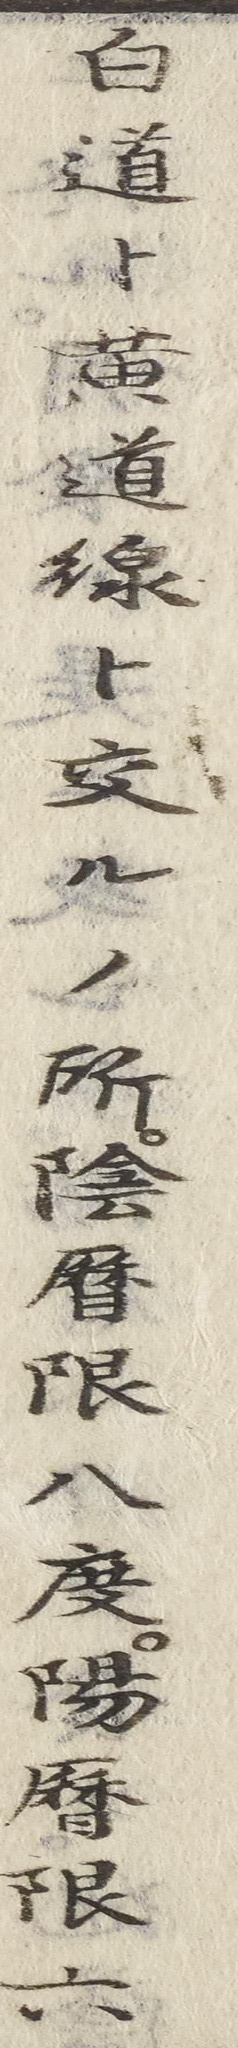白道ト黄道線ト交ルノ所。陰暦限八度。陽暦限六
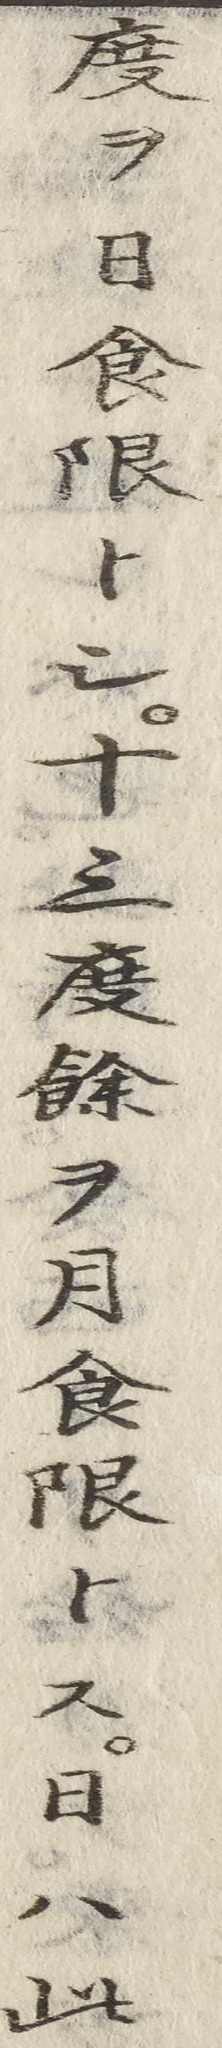度ヲ日食限トシ。十三度余ヲ月食限トス。日ハ此
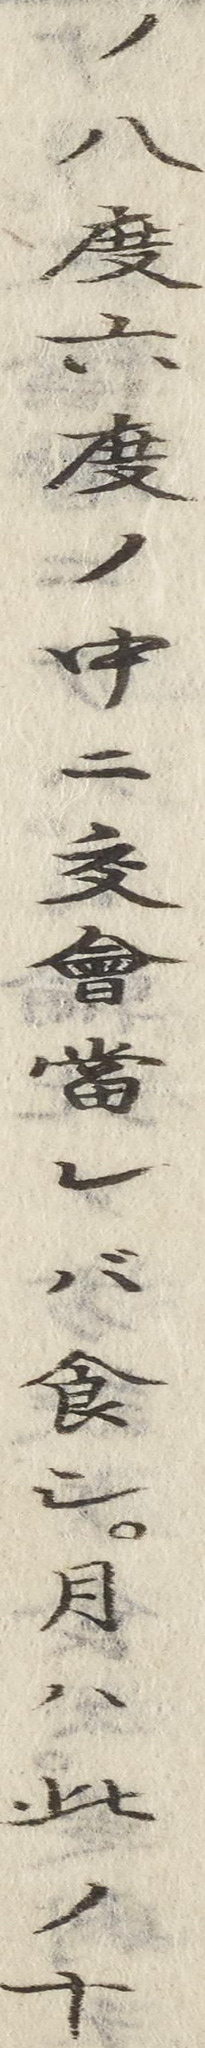ノ八度六度ノ中ニ交会当レバ食シ。月ハ此ノ十
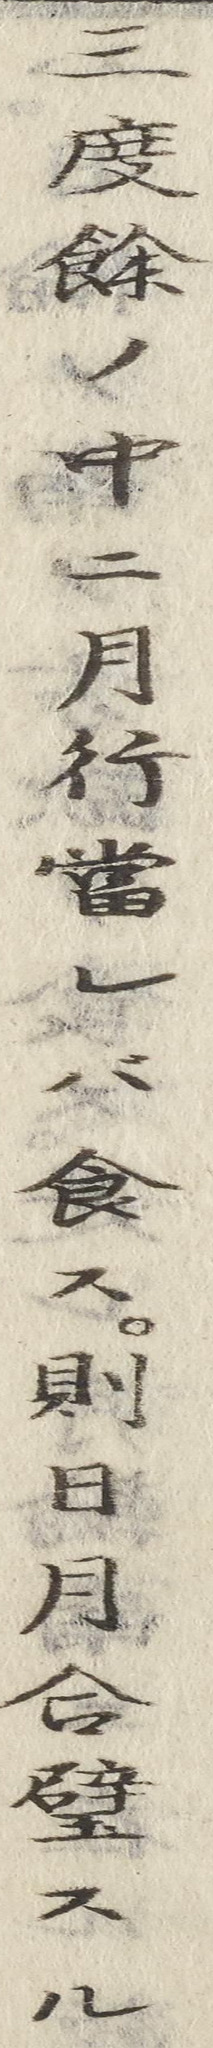三度余ノ中ニ月行当レバ食ス。則日月合璧スル
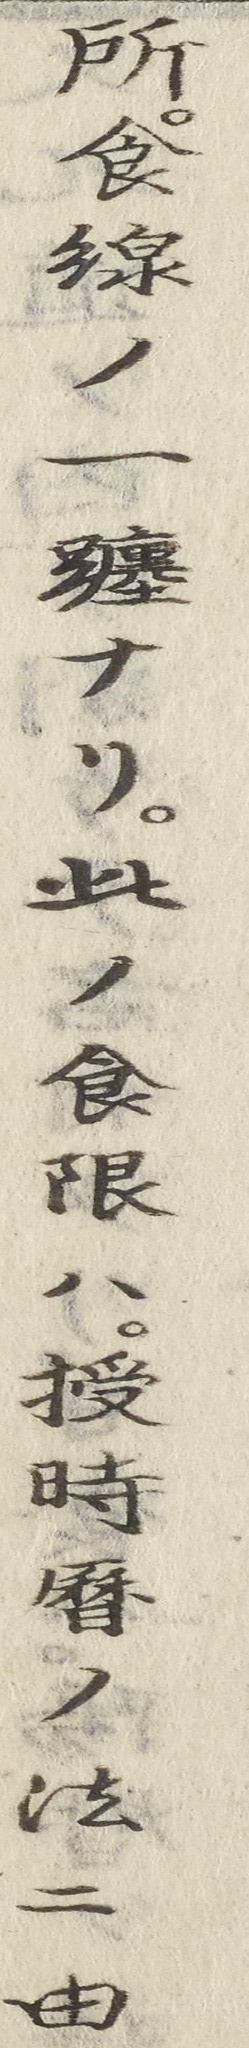所。食線ノ一躔ナリ。此ノ食限ハ。授時暦ノ法ニ由
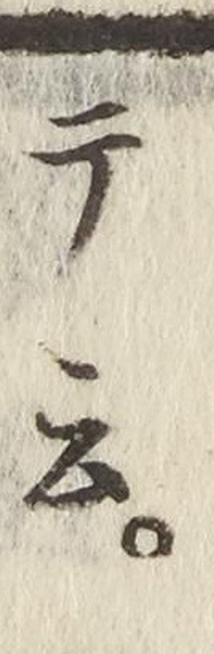テ云。
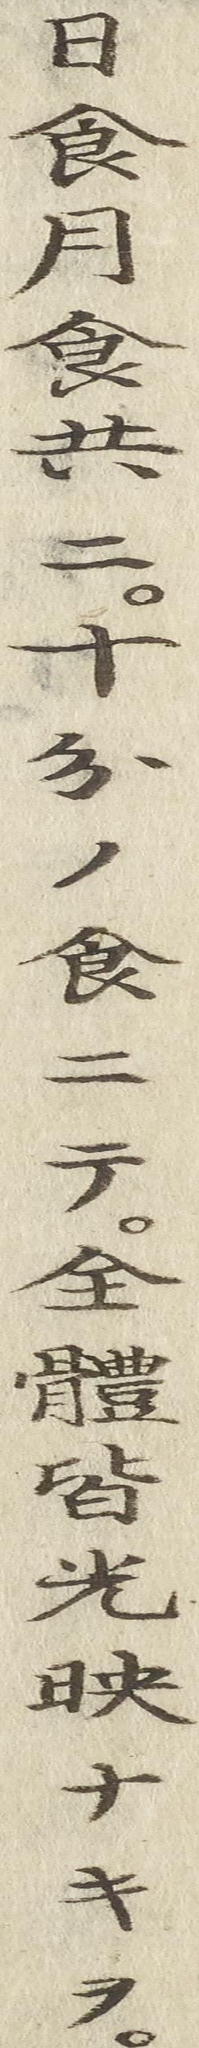日食月食共ニ。十分ノ食ニテ。全体皆光映ナキヲ。
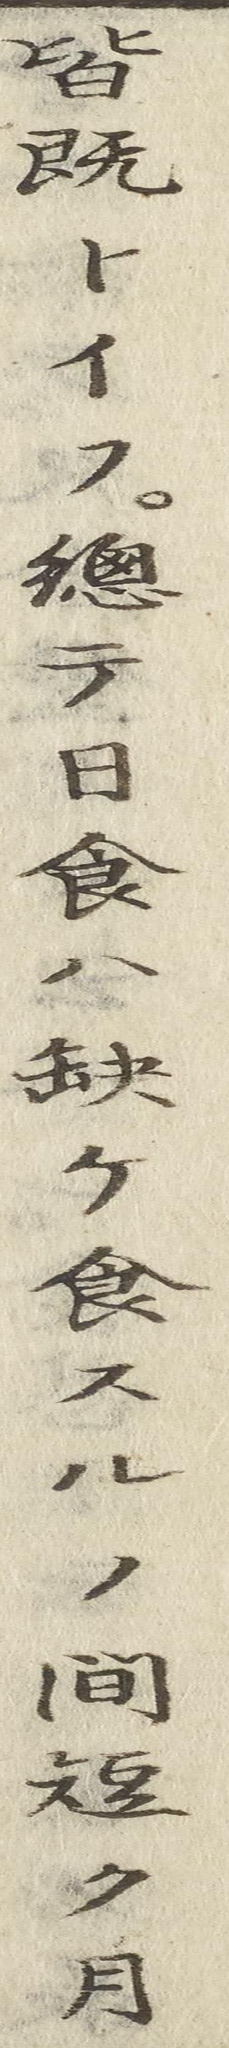皆既トイフ。総テ日食ハ缺ケ食スルノ間短ク月
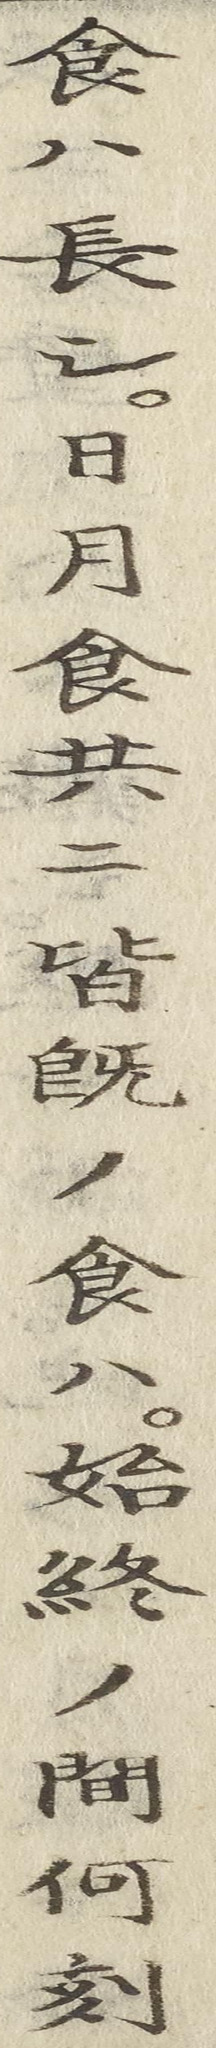食ハ長シ。日月食共ニ皆既ノ食ハ。始終ノ間何刻
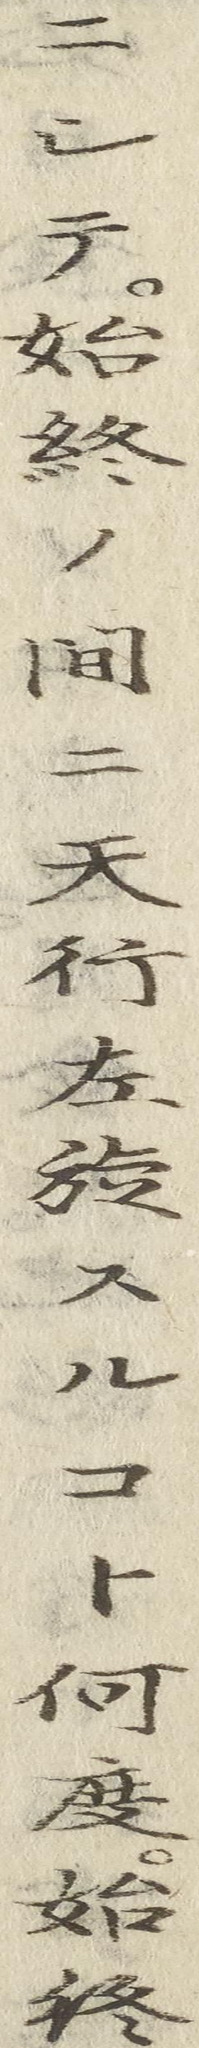ニシテ。始終ノ間ニ天行左旋スルコト何度。始終
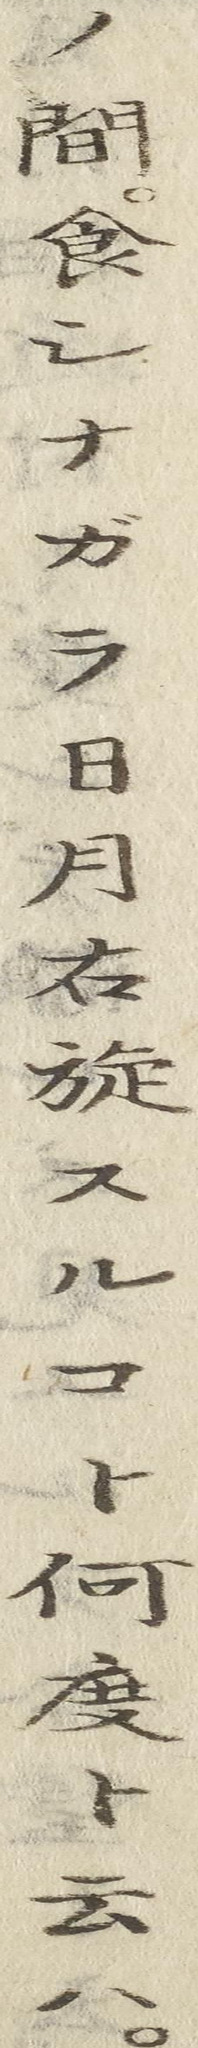ノ間。食シナガラ日月右旋スルコト何度ト云ハ。
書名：大略天学名目鈔　天經或問附録
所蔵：東京大学地震研究所図書室 Earthquake Research Institute Library, The University of Tokyo, JAPAN
